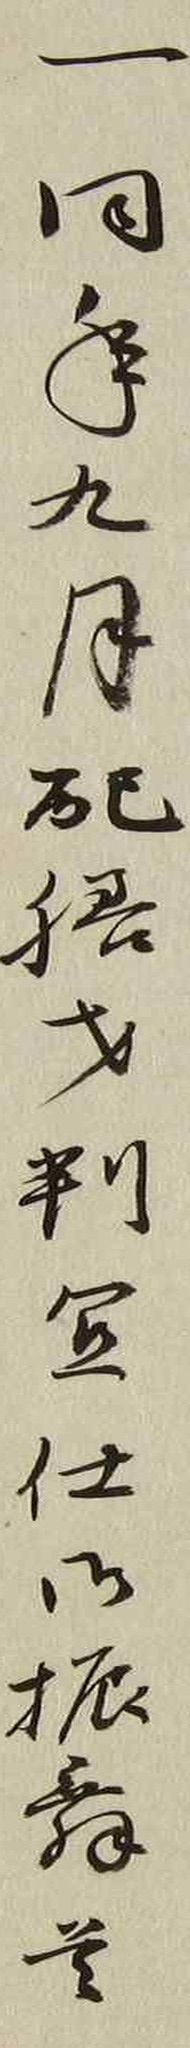一同年九月配膳才判宜仕御振舞首
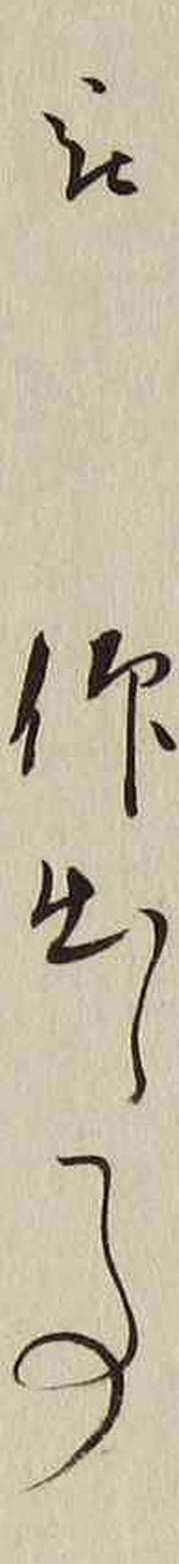被仰出候事
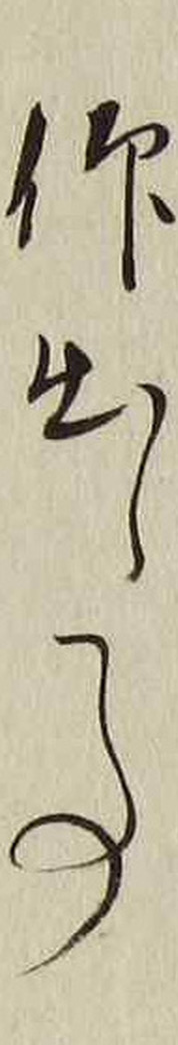仰出候事
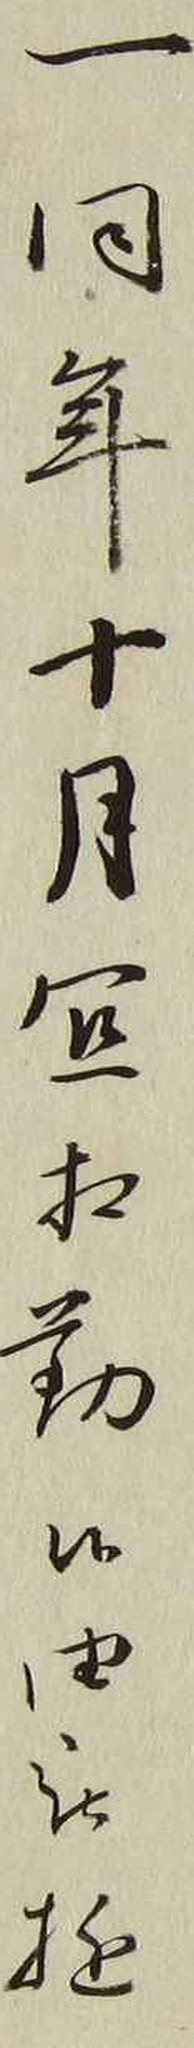一同年十月宜相勤候由被遊
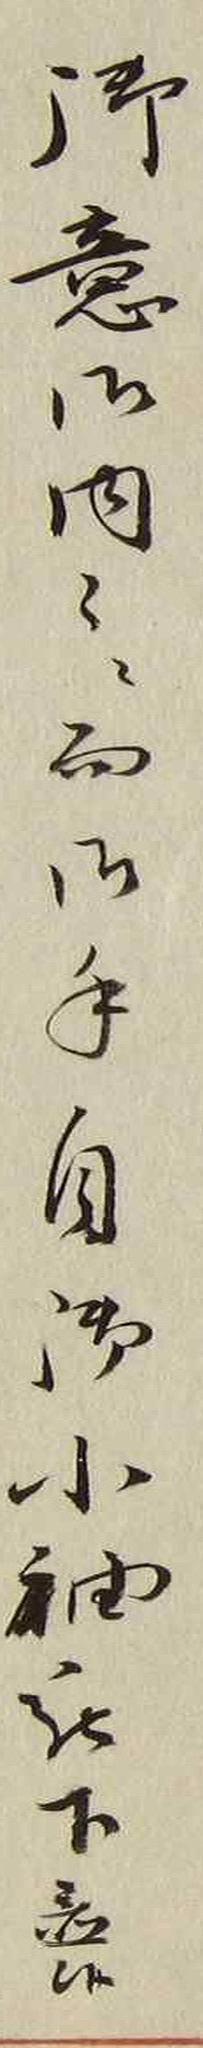御意御内々ニ而御手自御小袖被下置候

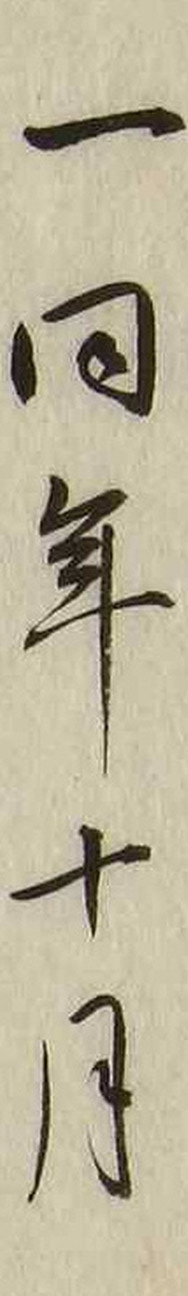一同年十月
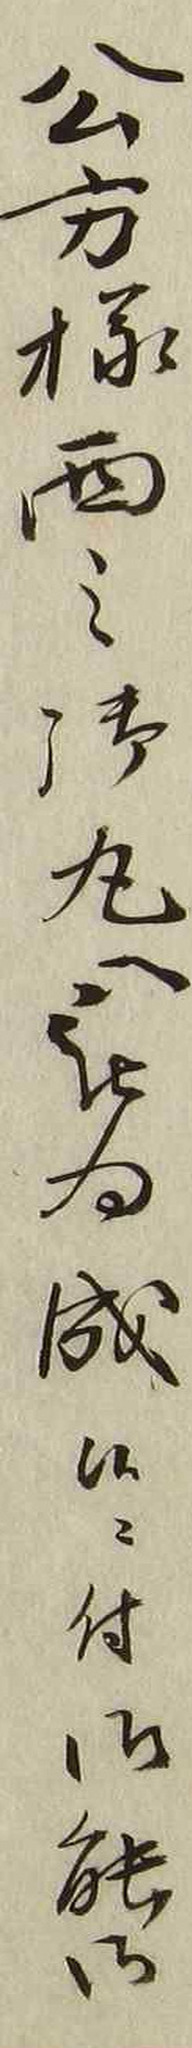公方様西之御丸へ被為成候ニ付御能御
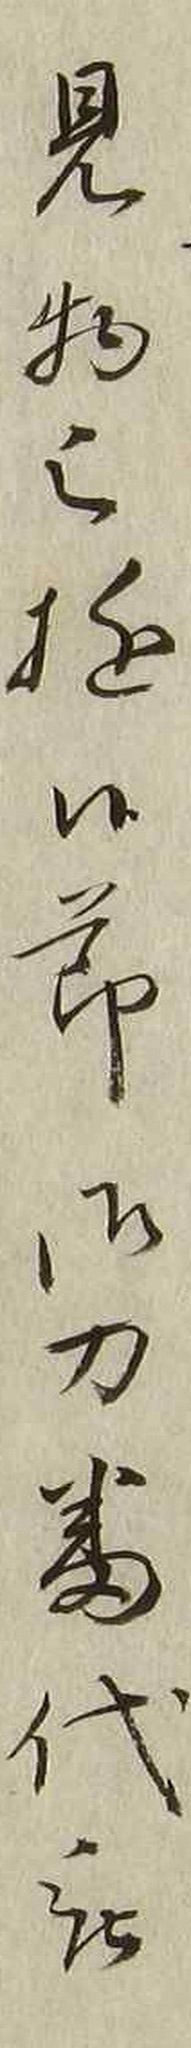見物被遊候節御刀番代被
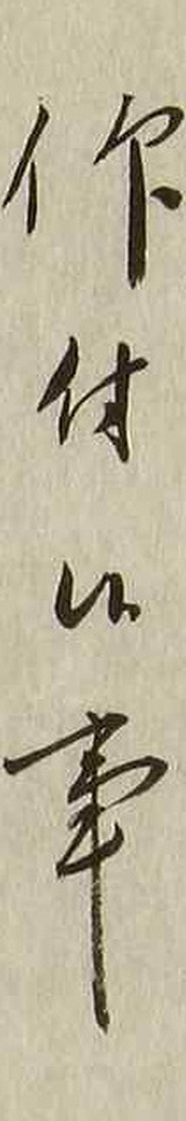仰付候事
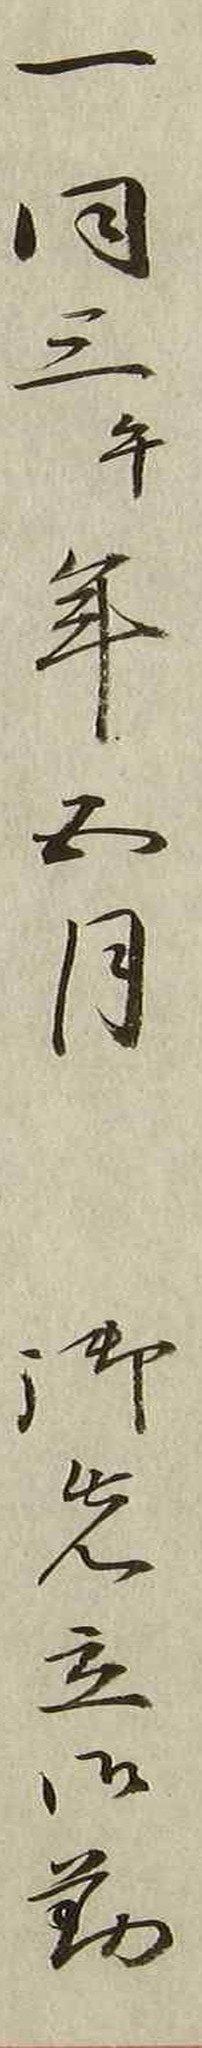一同三午年五月御先立御勤
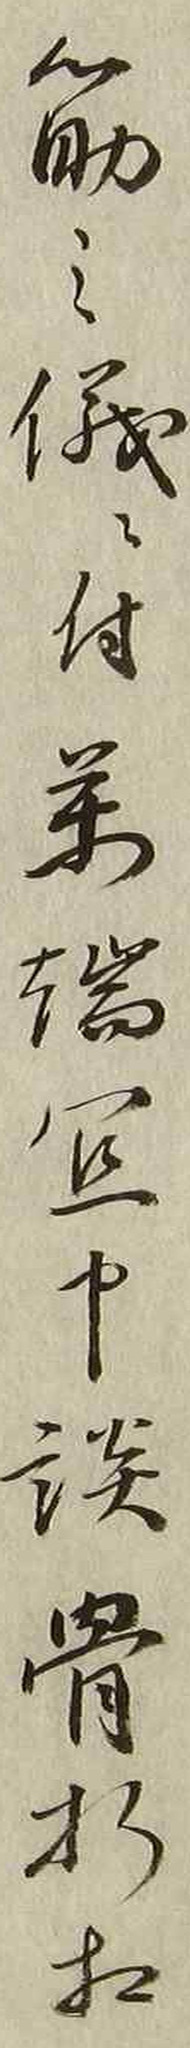筋之儀ニ付万端宜申談骨折相
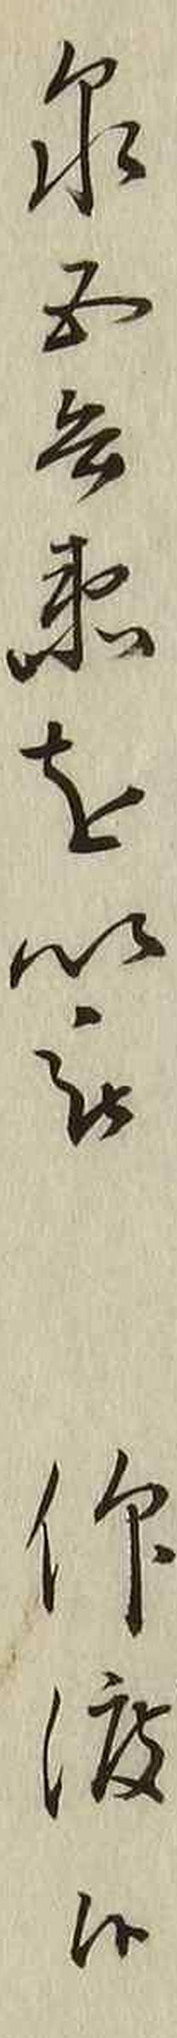泉五兵衛を以被仰渡候
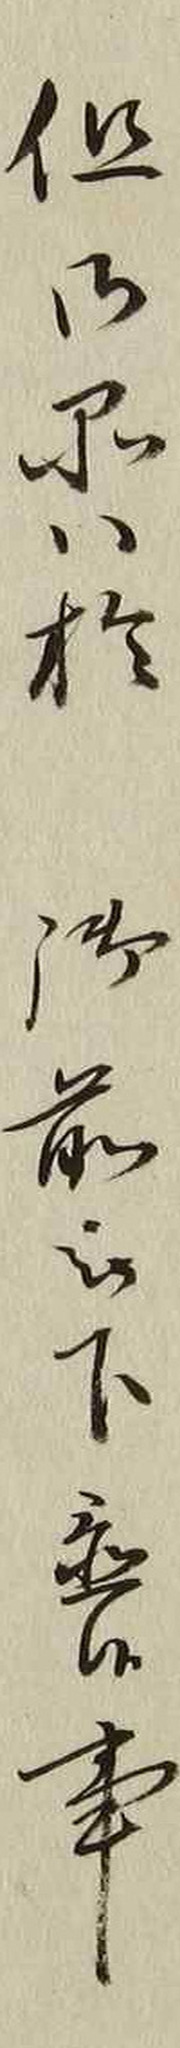但し御品ハ於御前被下置候事
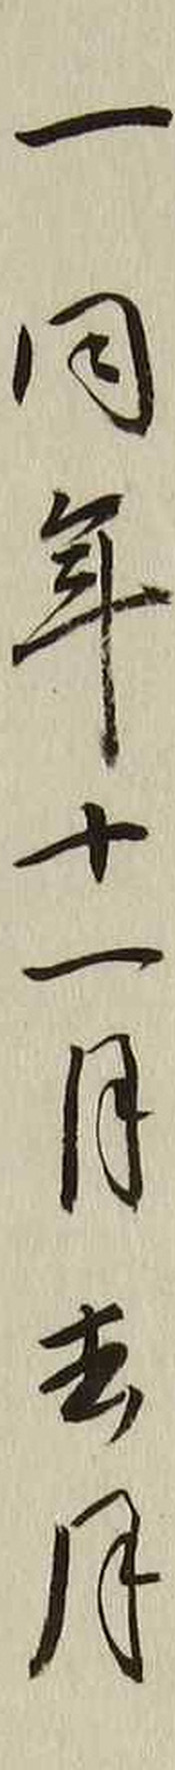一同年十一月去月
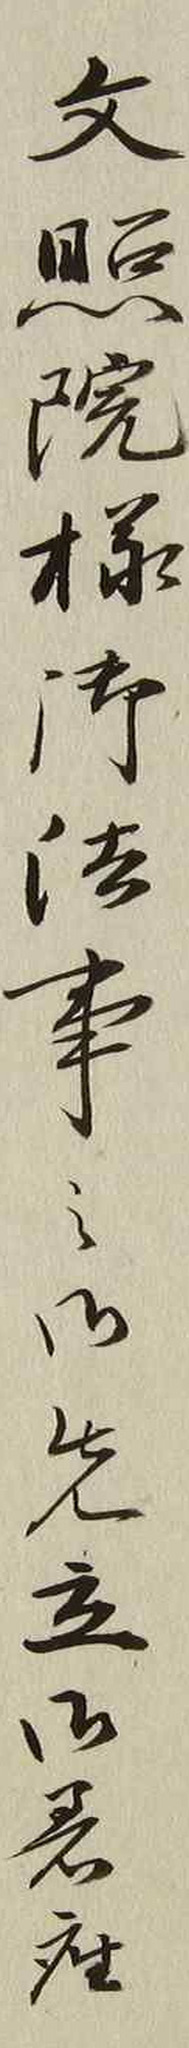文照院様御法事之御先立御着座
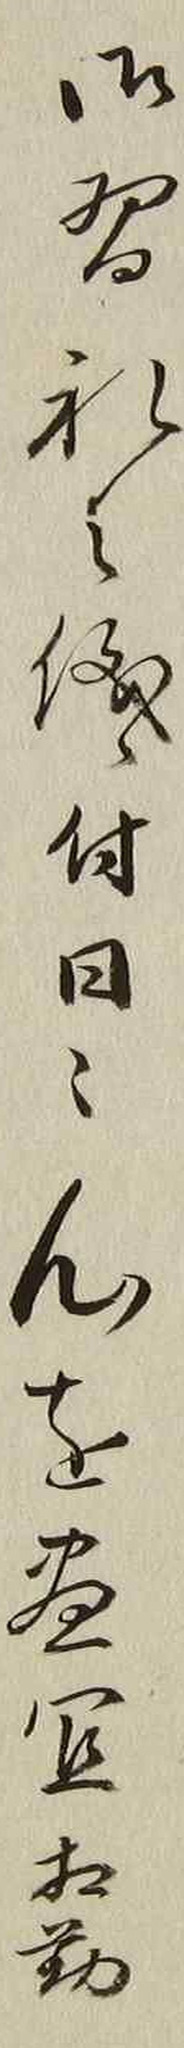御習礼之儀ニ付日々心を尽宜相勤
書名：諸士系譜　巻之19　い之部19
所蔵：会津若松市立会津図書館
